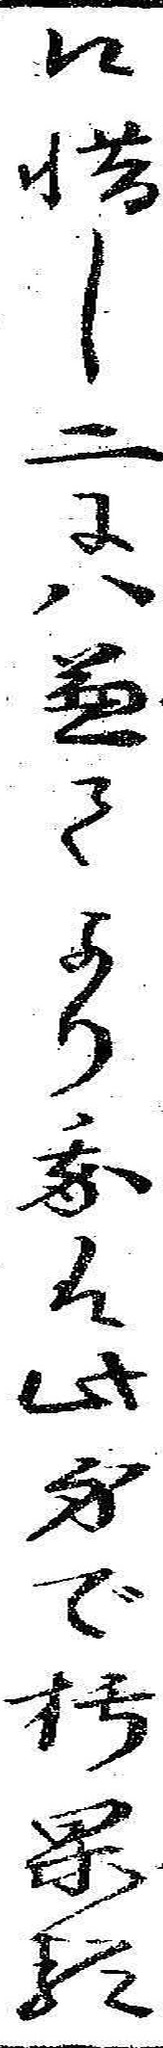口惜し二には兼てより我は此身で朽果る
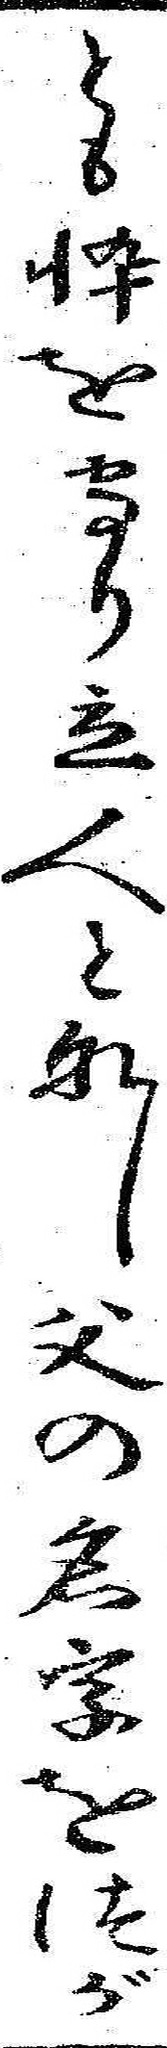とも忰を守り立人となし父の名字をつが
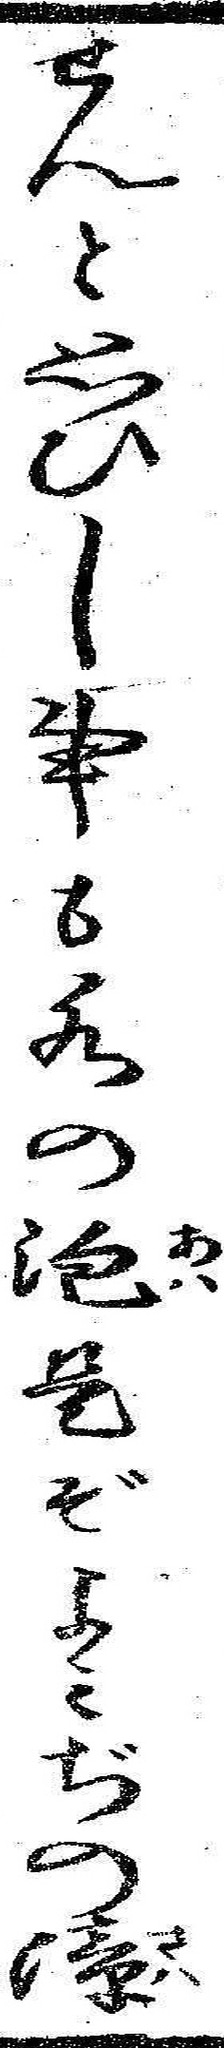せんと思ひし事も水の泡是ぞよみぢの障
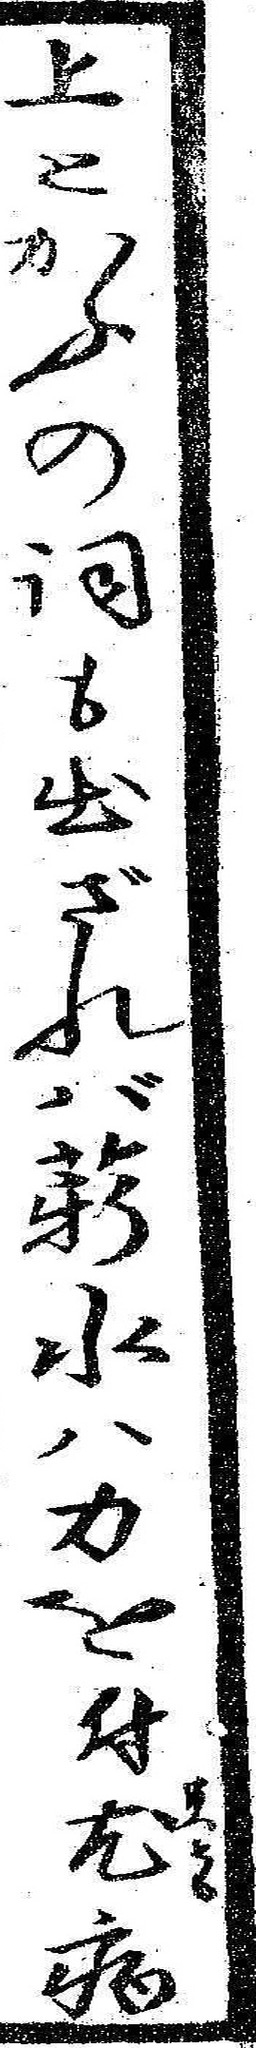上とかふの詞も出ざれば薪水は力を付尤病
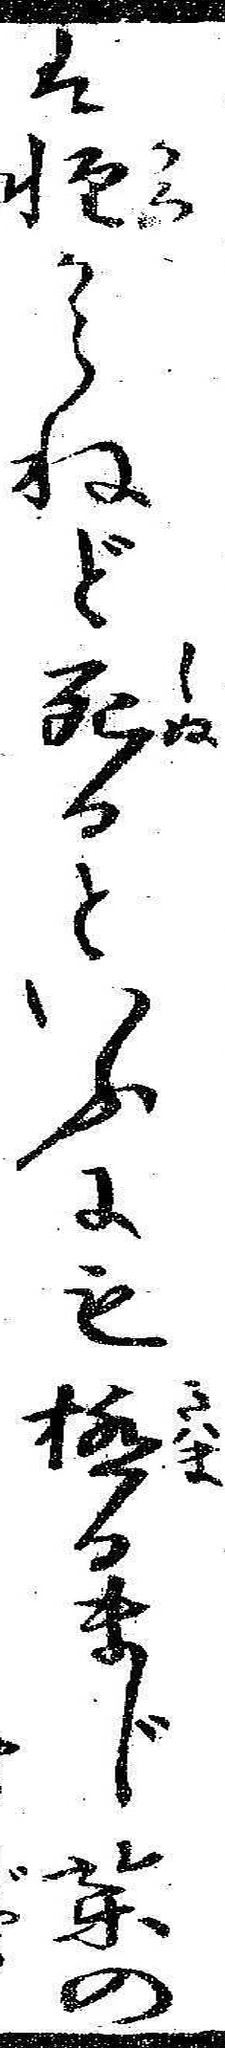は軽からねど死るといふにも極るまじ薬の
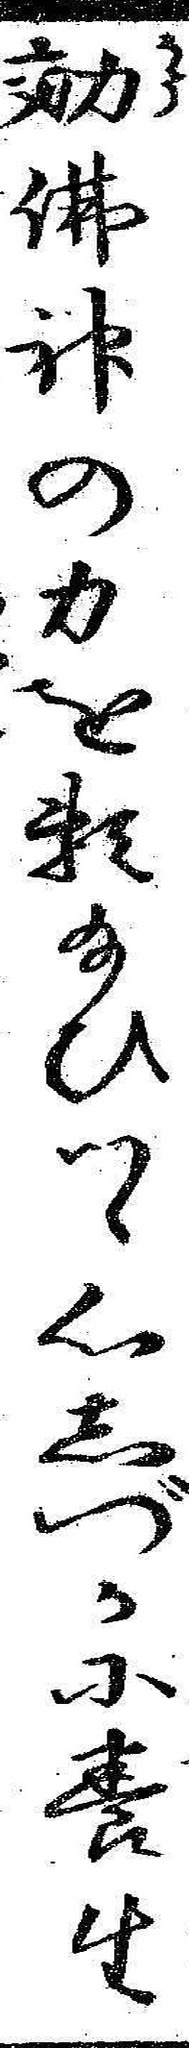効仏神の力を頼給ひツゝ心しづかに養生
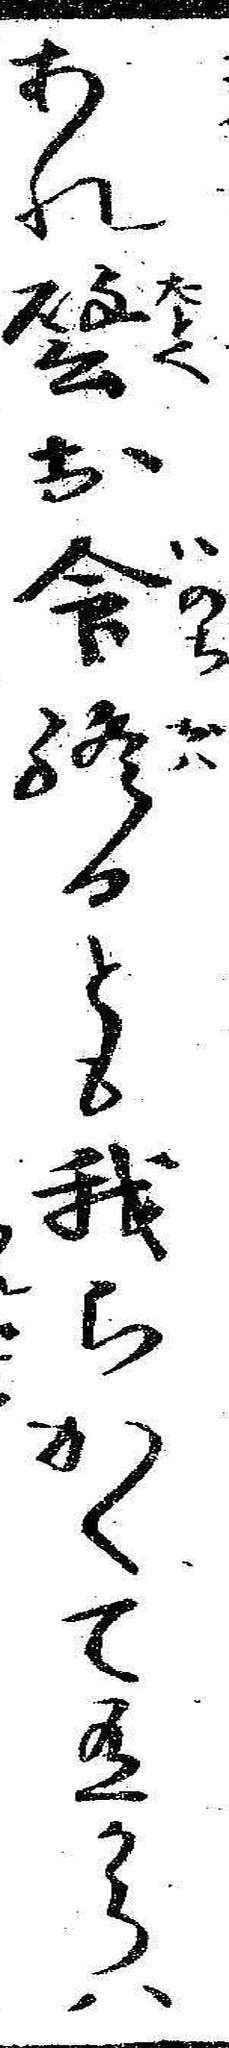あれ譬お命終るとも我らかくて有からは
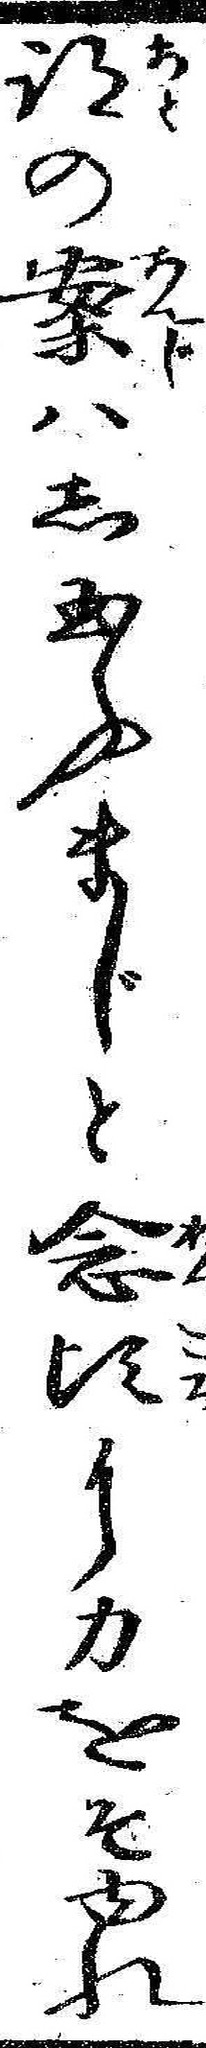跡の案はし玉ふまじと念頃に力をそゆれ
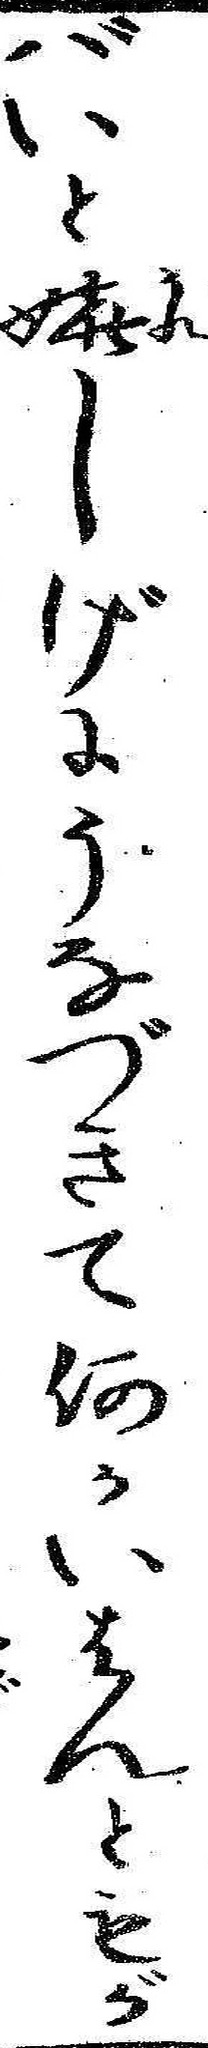ばいと嬉しげにうなづきて何かいはんともが
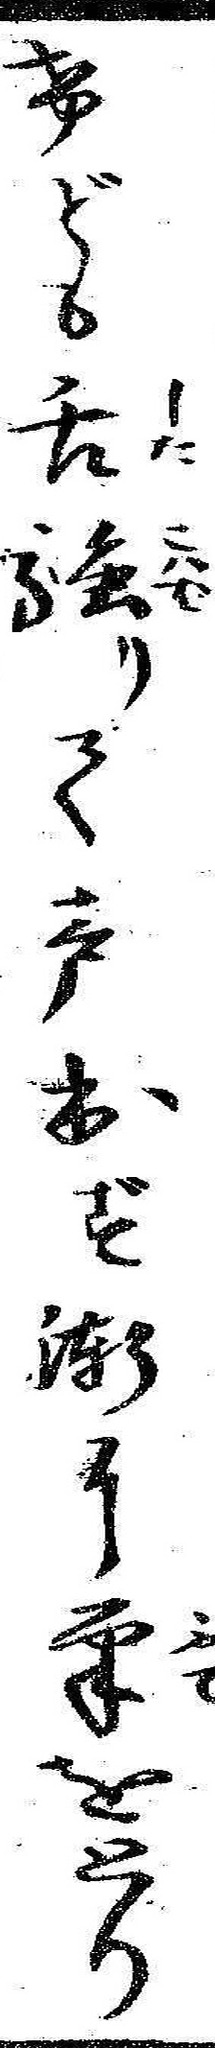けども舌強声出ず漸に筆をとり
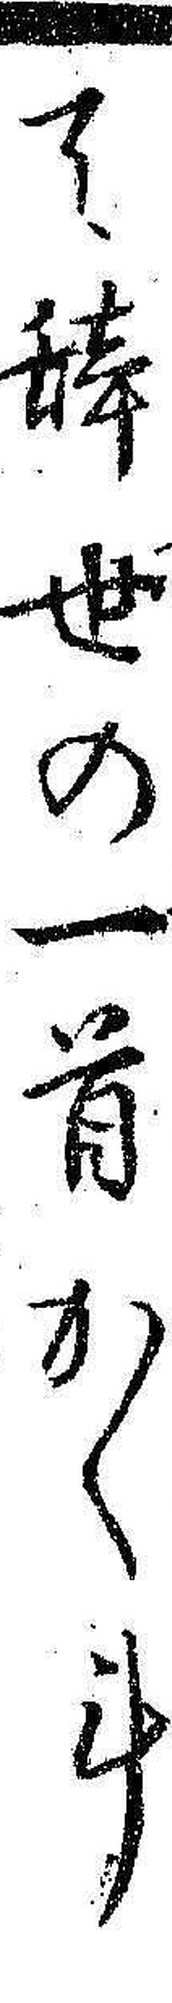て辞世の一首かく計
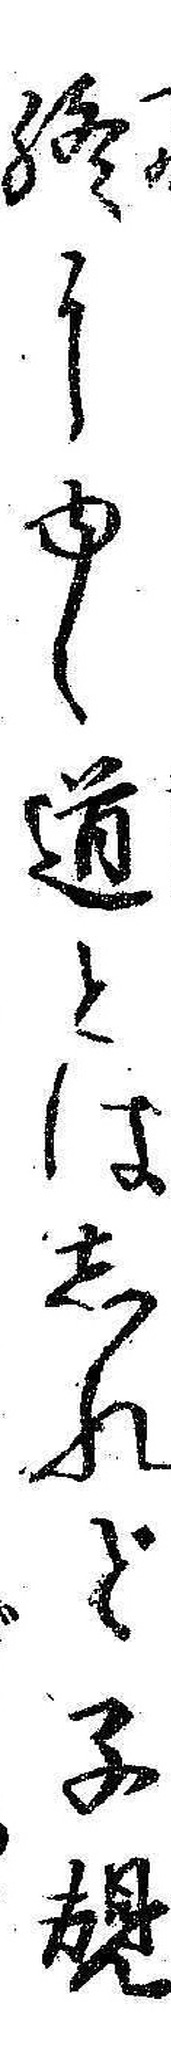終にゆく道とはしれど子規
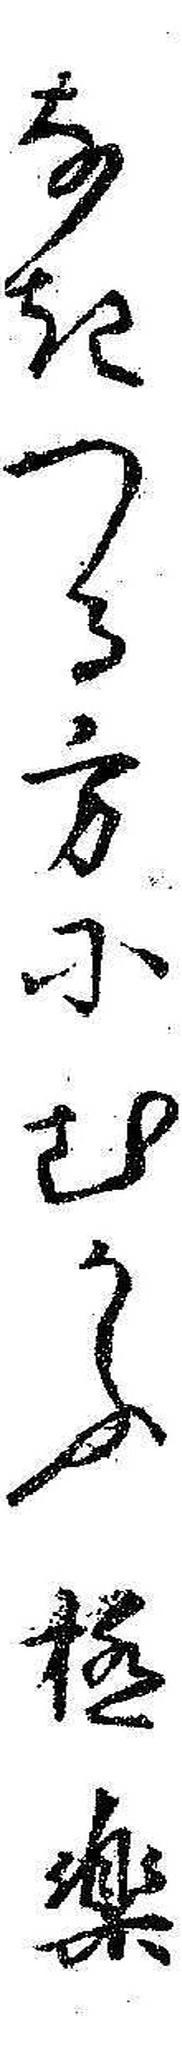なきつる方にむかふ極楽

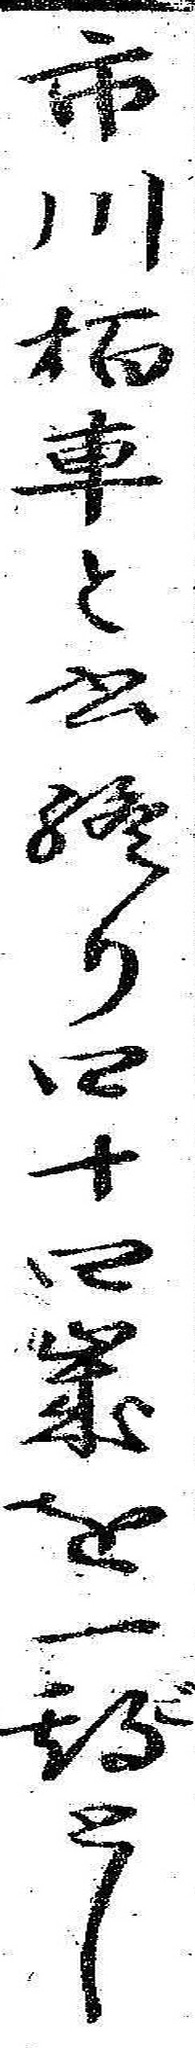市川栢車と書終り四十四歳を一期とし
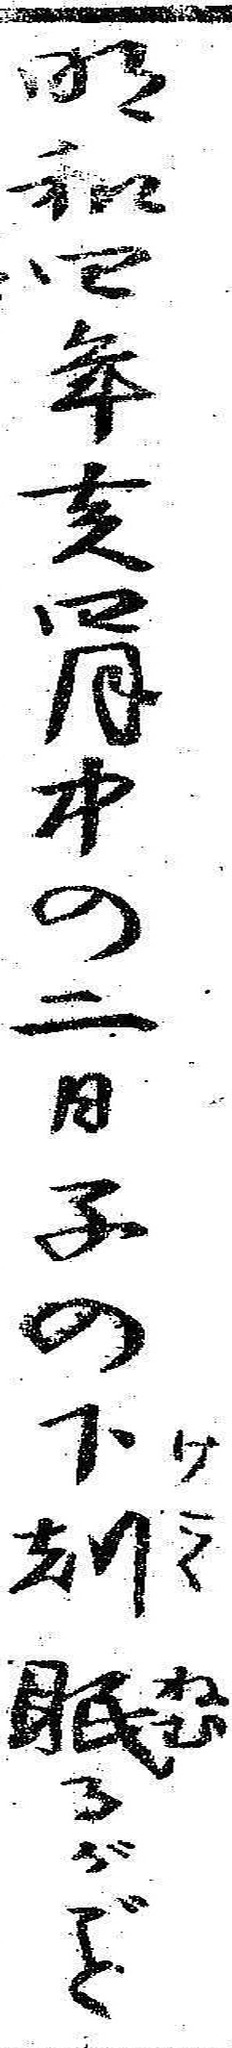明和四年亥四月中の二日子の下刻眠るがごと
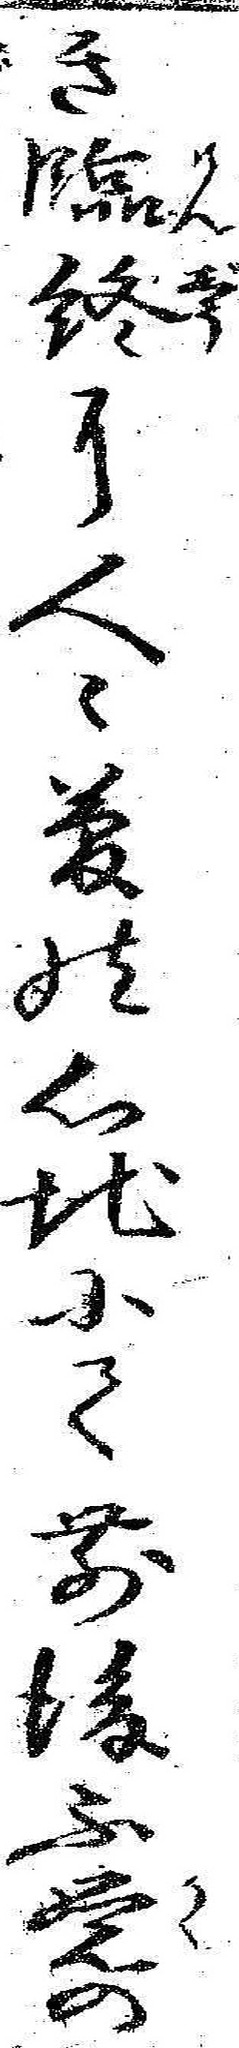き臨終に人々夢の心地にて前後不覚の
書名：根無草後編
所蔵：国文学研究資料館
